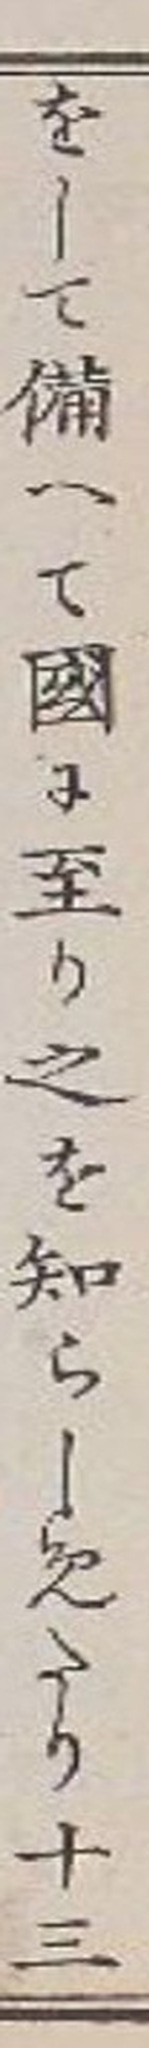をして備へて国に至り之を知らしめたり十三
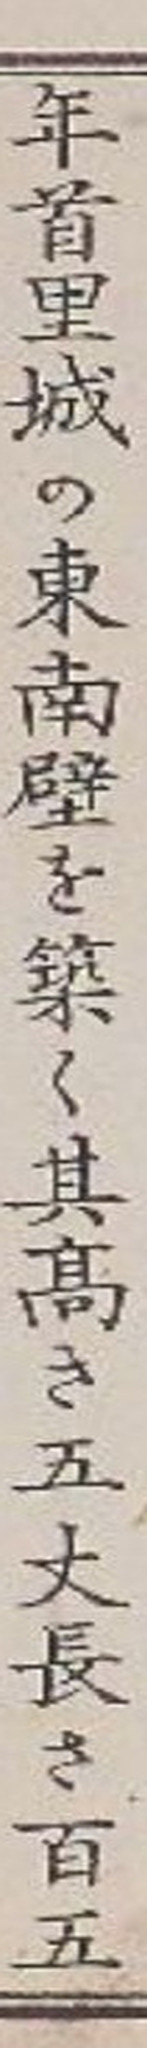年首里城の東南壁を築く其高さ五丈長さ百五
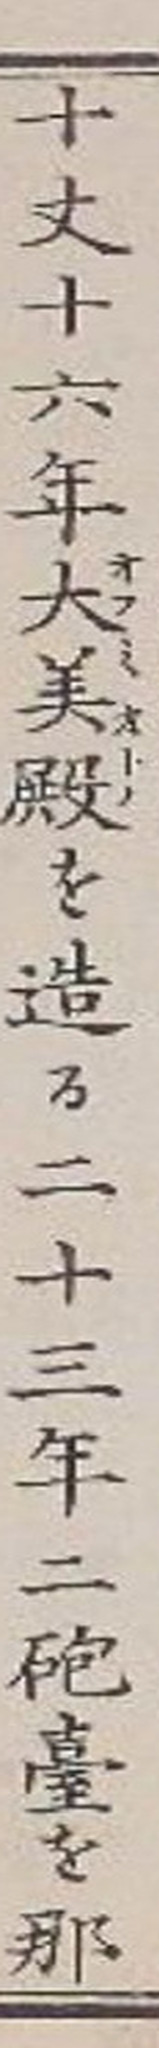十丈十六年大美殿を造る二十三年二砲台を那
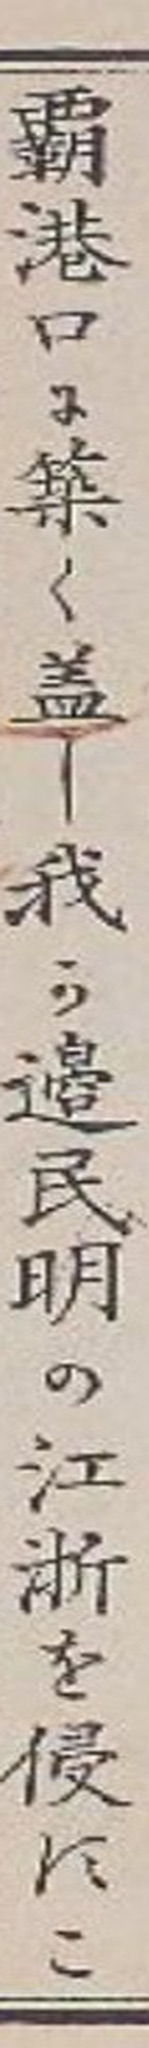覇港口に築く盍し我ら邉民明の江浙を侵すこ

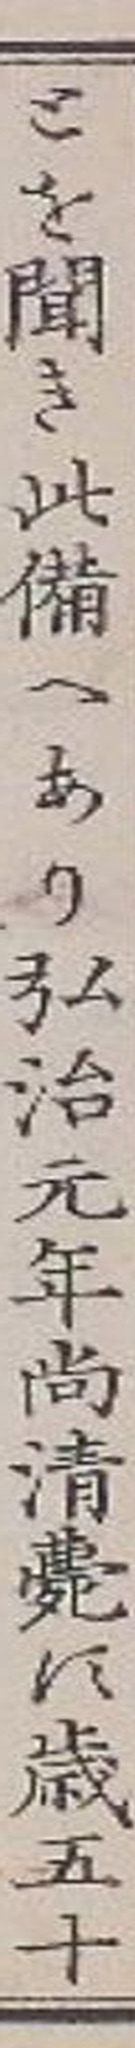とを聞き此備へあり弘治元年尚清薨す歳五十
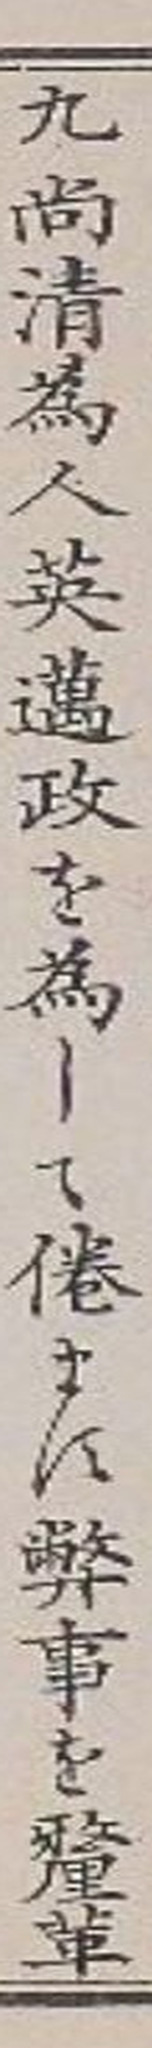九尚清為人英邁政を為して倦ます弊事を
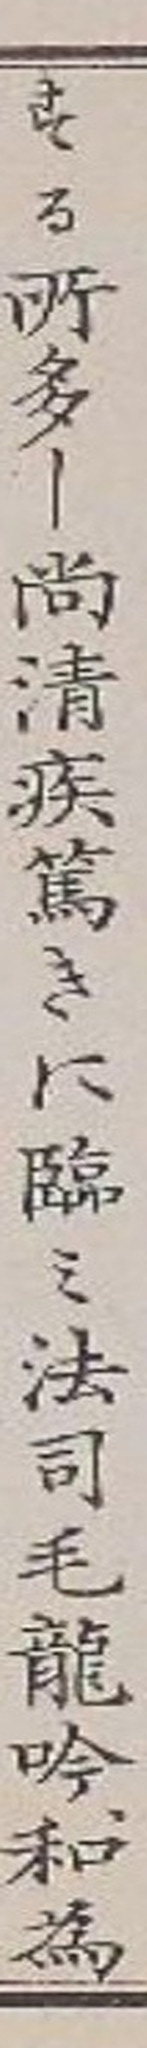する所多し尚清疾篤きに臨み法司毛龍吟和為
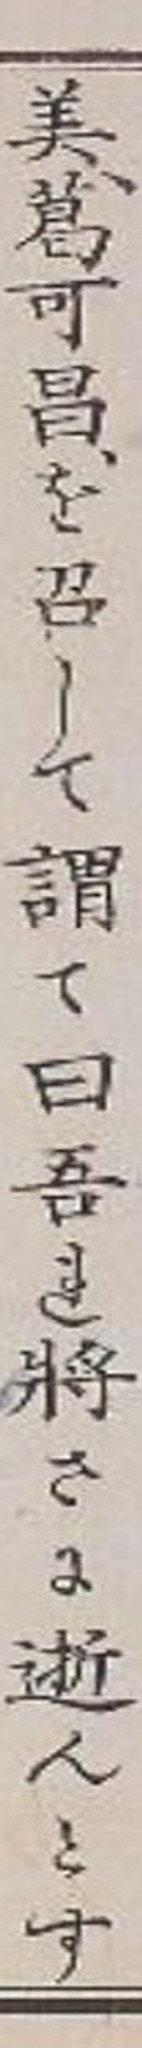美葛可昌を召して謂て曰吾れ将さに逝んとす
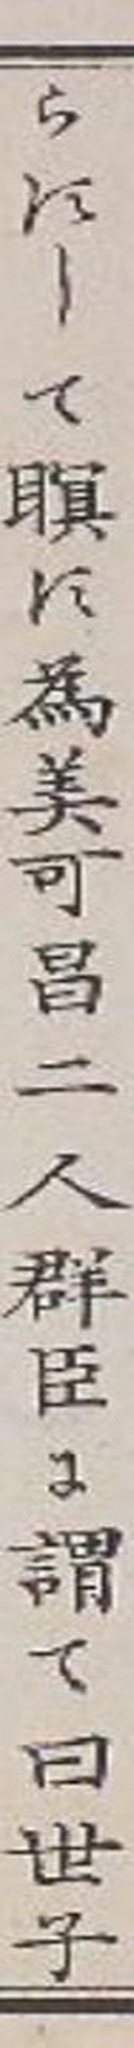らすして瞑す為美可昌二人群臣に謂て曰世子
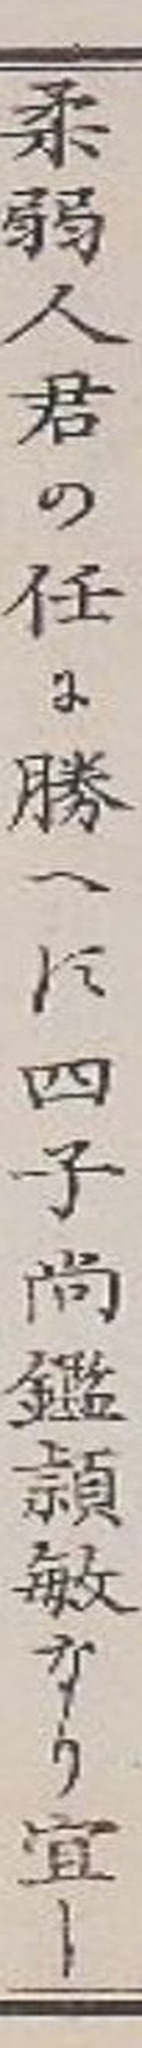柔弱人君の任に勝へず四子尚鑑頴敏なり宜し
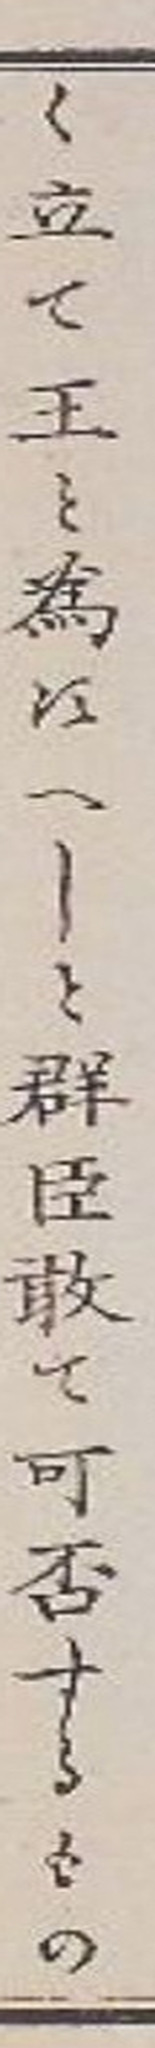く立て王と為すべしと群臣敢て可否するもの
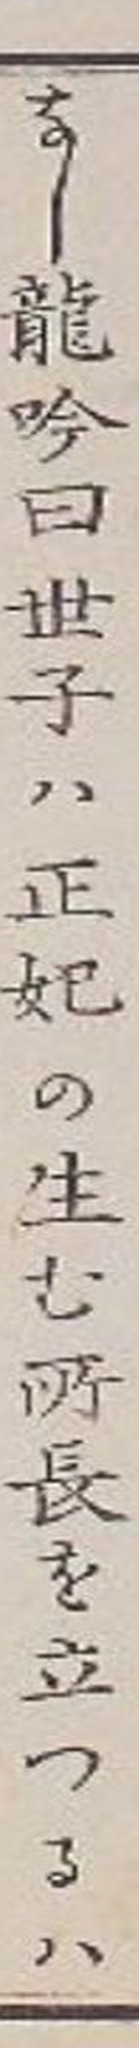なし龍吟曰世子は正妃の生む所長を立つるは
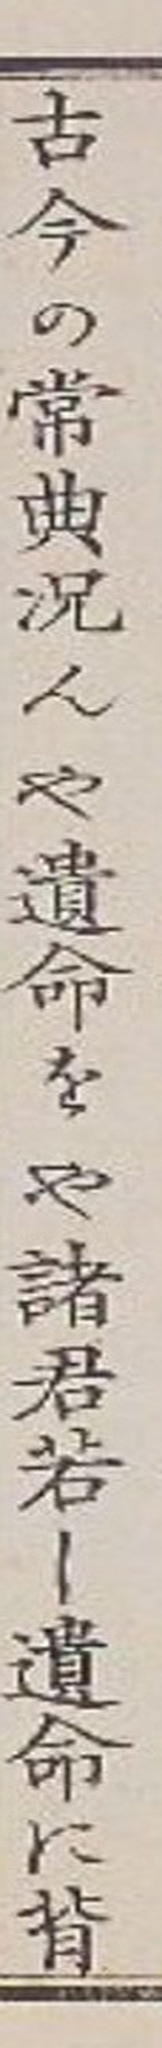古今の常典況んや遺命をや諸君若し遺命に背
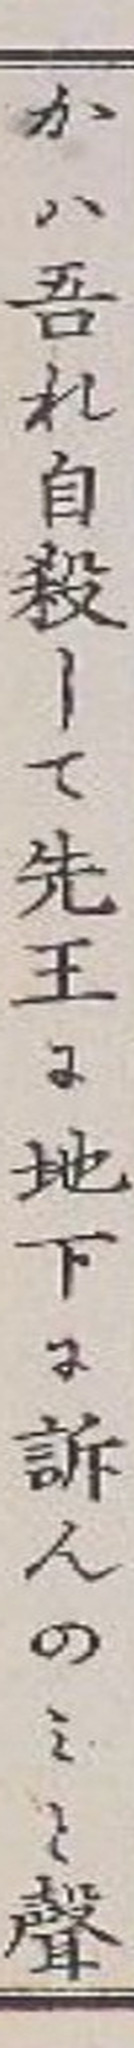かば吾れ自殺して先王に地下に訴んのみと声
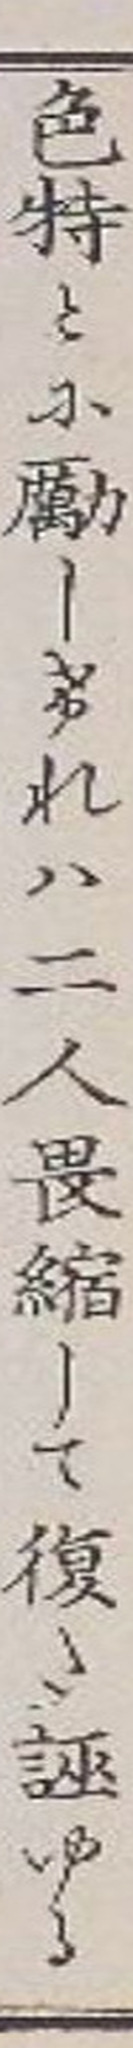色特とに励しければ二人畏縮して復た誣ふる
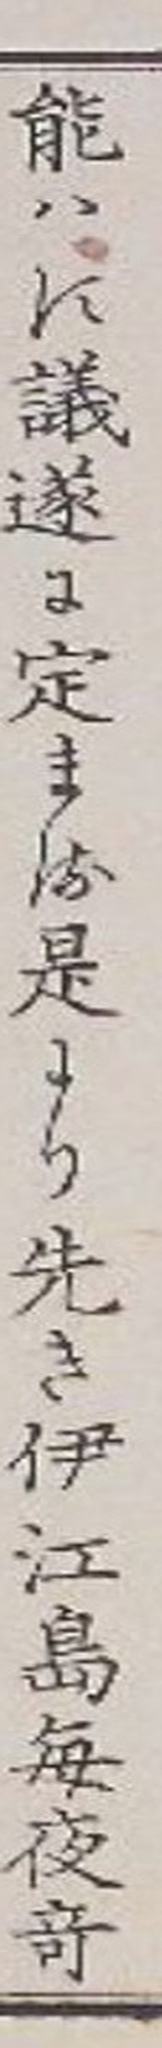能はず議遂に定まる是より先き伊江島毎夜奇
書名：南島紀事 中
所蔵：University of the Ryukyus Library
